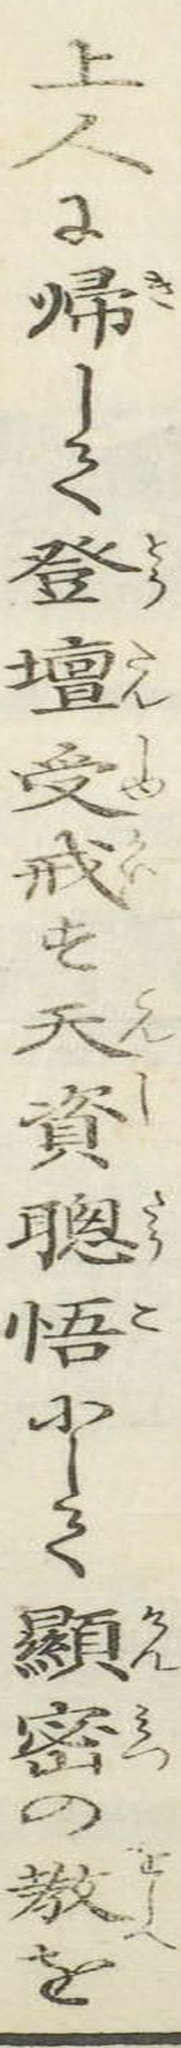上人に帰して登壇受戒す天資聰悟にして顕密の教を
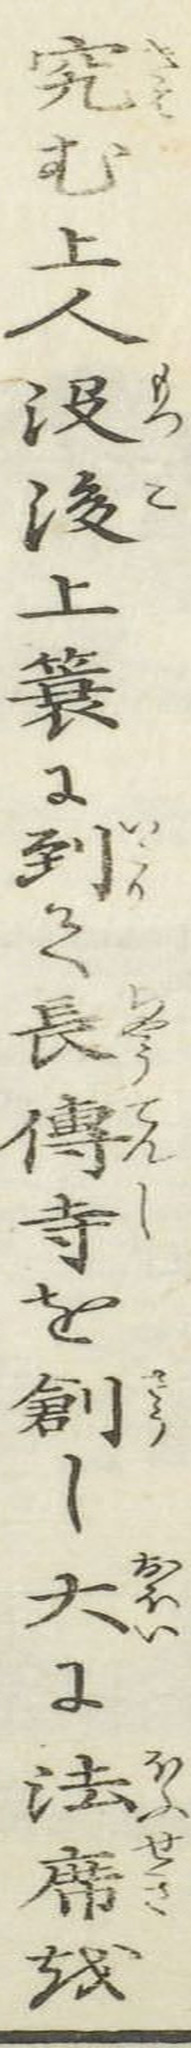究む上人没後上蓑に到て長傳寺を創し大に法席を
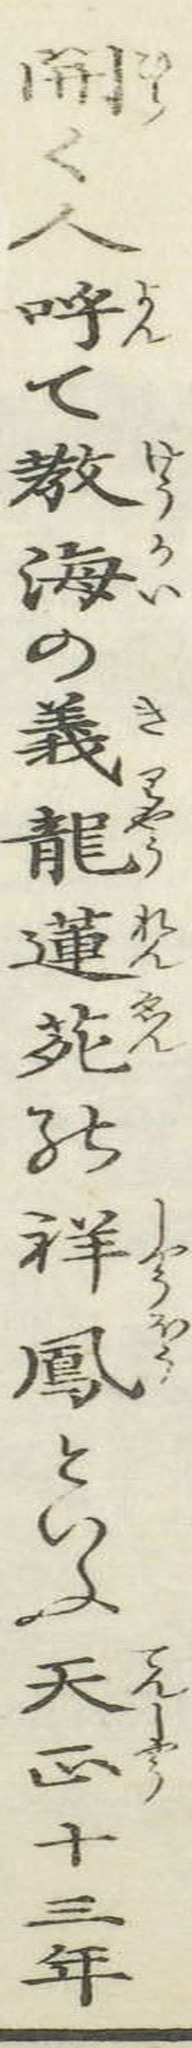開く人呼て教海の義龍蓮苑の祥鳳といふ天正十三年
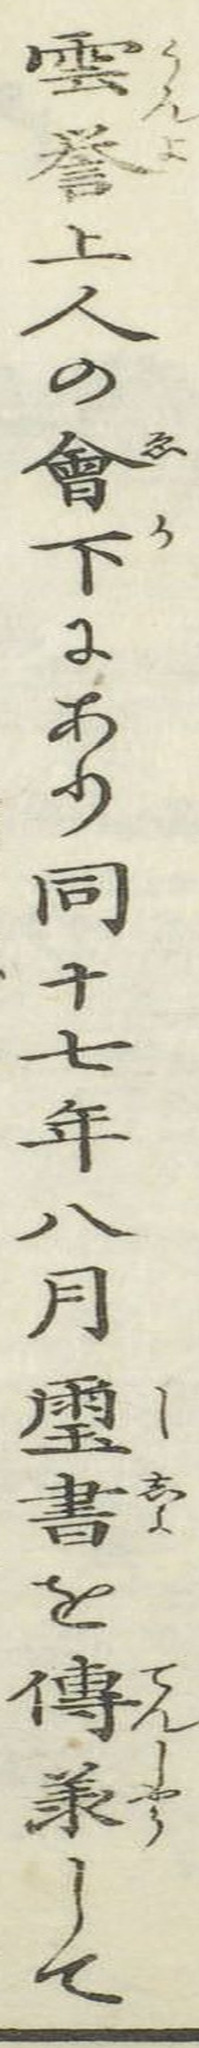雲誉上人の會下にあり同十七年八月璽書を傳承して
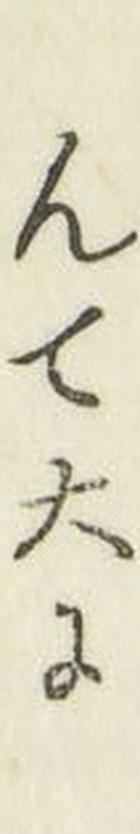んて大に
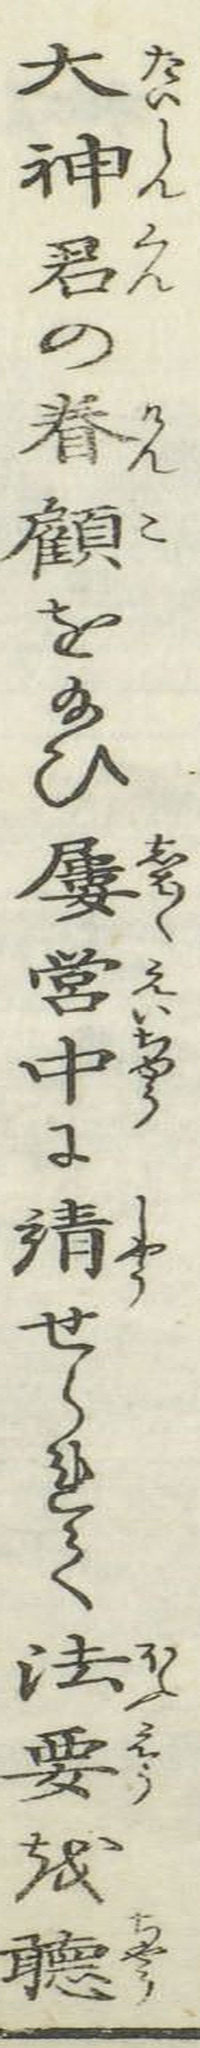大神君の眷顧を給ひ屡営中に請せられて法要を聴
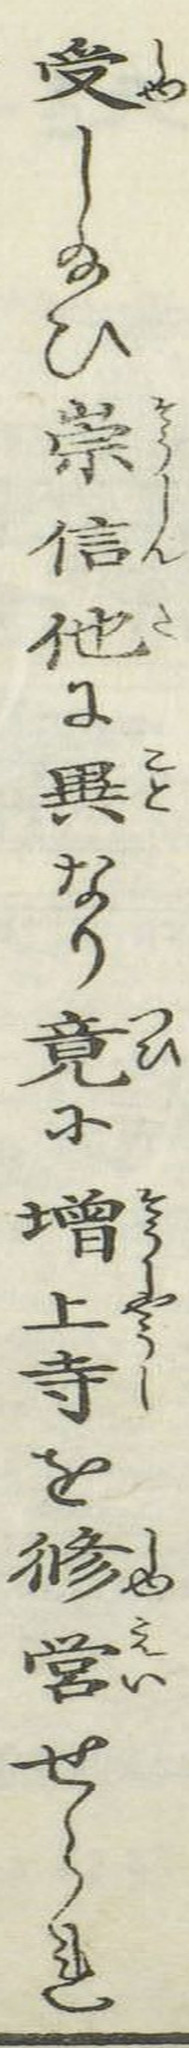受し給ひ崇信他に異なり竟に増上寺を修営せられ
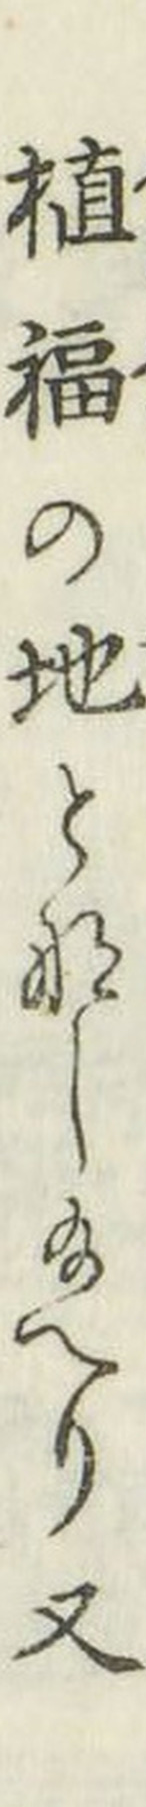植福の地となし給へり又
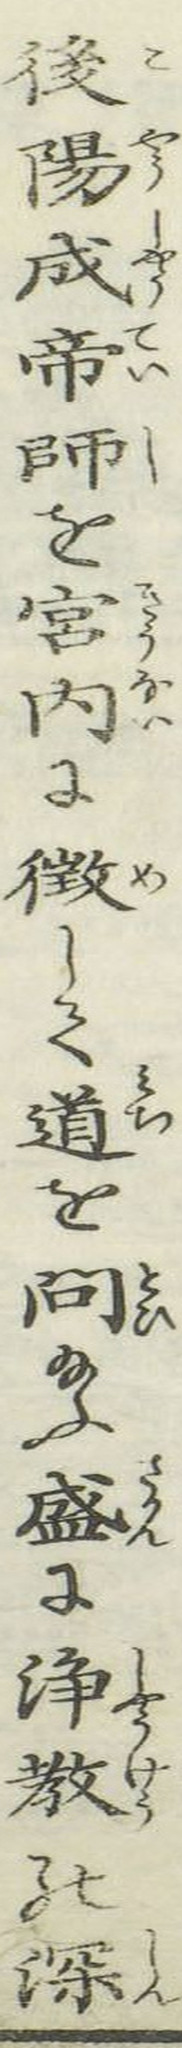後陽成帝師を宮内に徴して道を問給ふ盛に浄教の深
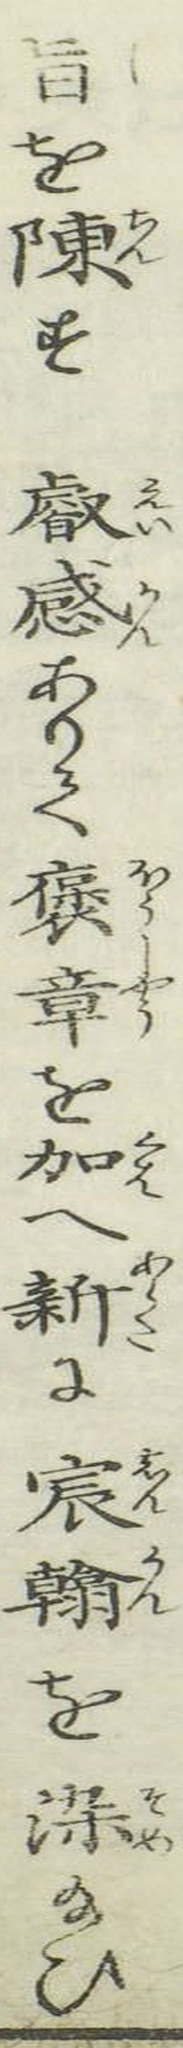旨を陳す叡感ありて褒章を加へ新に宸翰を染給ひ
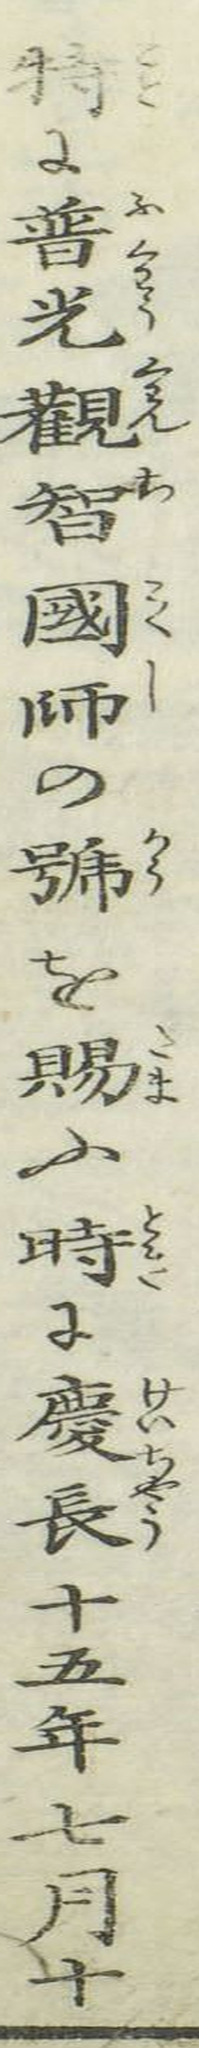特に普光観智國師の号を賜ふ時に慶長十五年七月十
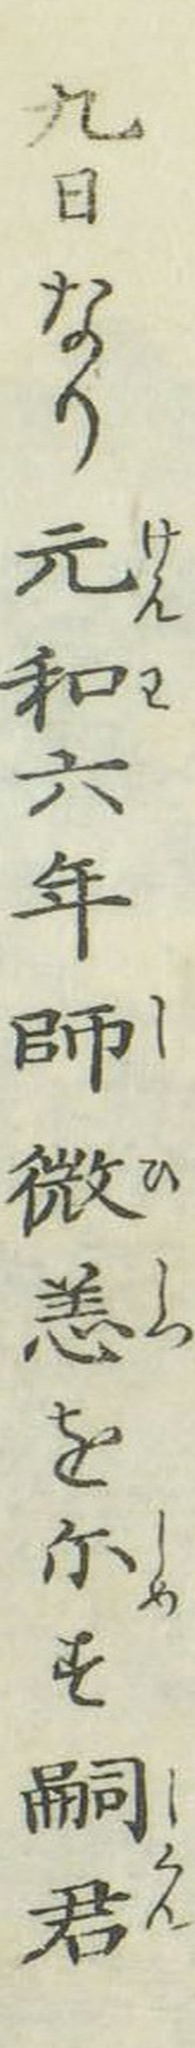九日なり元和六年師微恙を示す嗣君

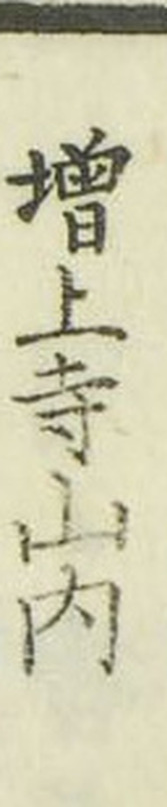増上寺山内
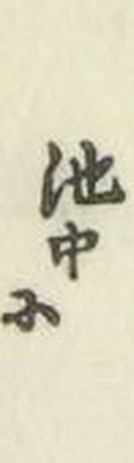池中に

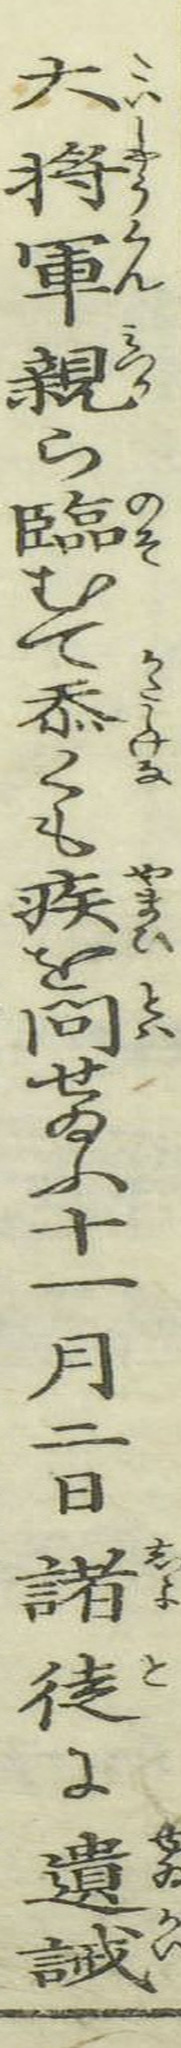大将軍親ら臨むて忝くも疾を問せ給ふ十一月二日諸徒に遺誡
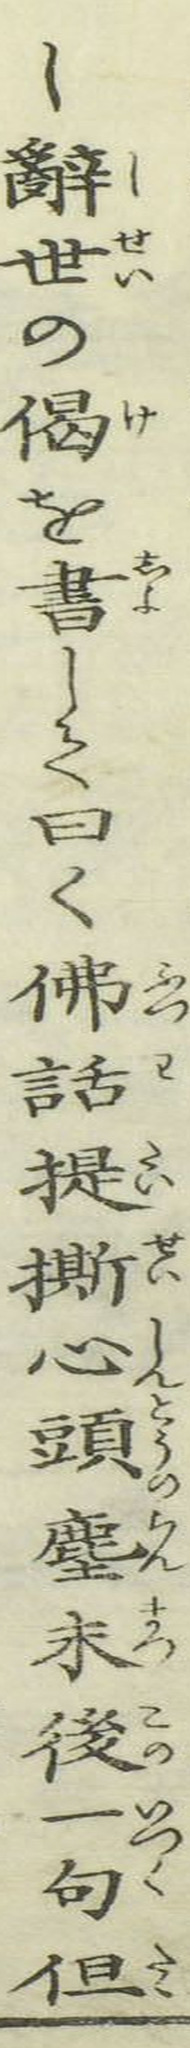し辞世の偈を書して曰く佛話提撕心頭塵末後一句但
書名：江戸名所図会 20巻 巻之3
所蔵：東京学芸大学教育コンテンツアーカイブ
